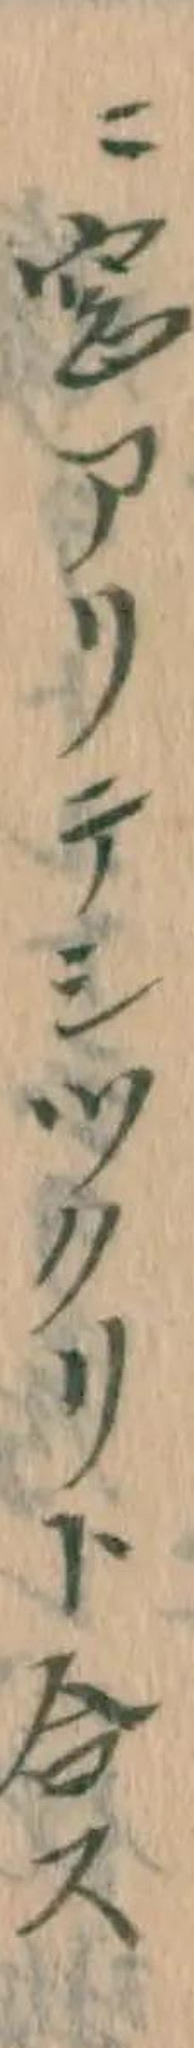ニ窓アリテシツクリト合ス

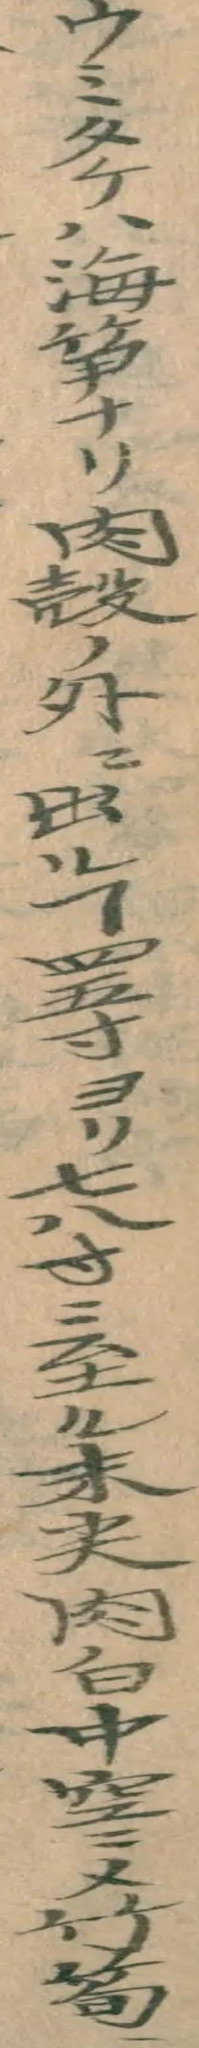ウミタケハ海笋ナリ肉殻ノ外ニ出ルコト四五寸ヨリ七八寸ニ至ル末尖肉白中空ニシテ竹筍ニ
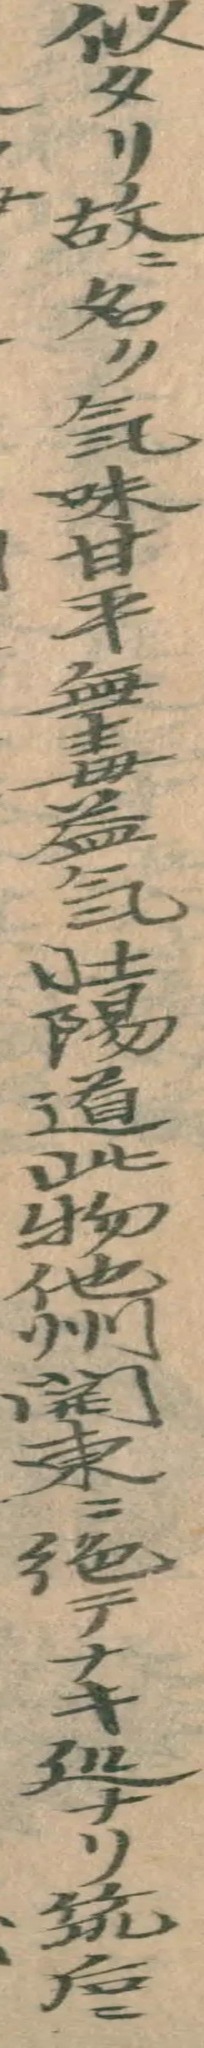似タリ故ニ名ク気味甘平無毒益気壮陽道此物他州関東ニ絶テナキ処ナリ筑后ニ
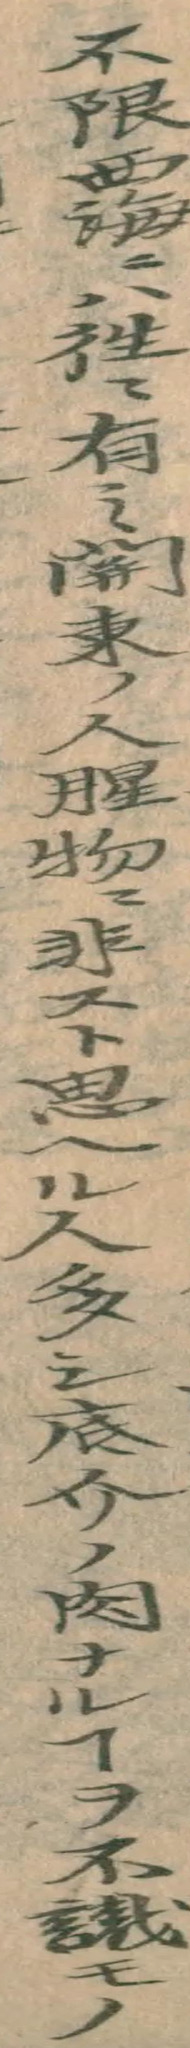不限西海ニハ往々有之関東ノ人腥物ニ非スト思ヘル人多シ底介ノ肉ナルコトヲ不識モノ
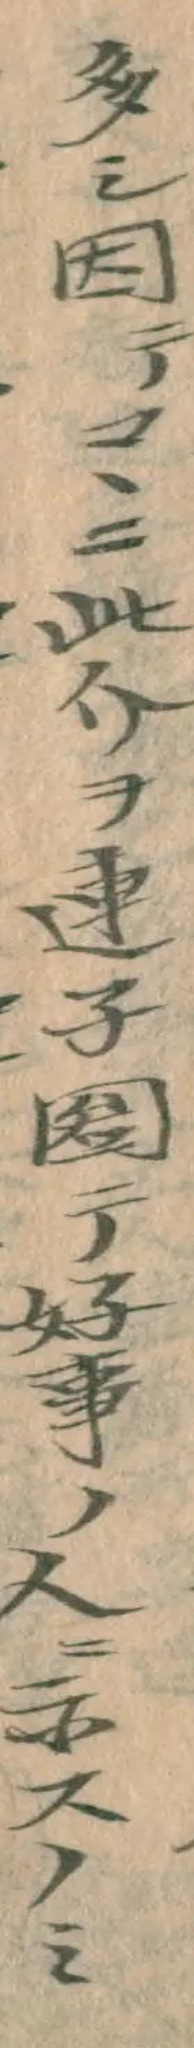多シ因テコヽニ此介ヲ連子圗テ好事ノ人ニ示スノミ
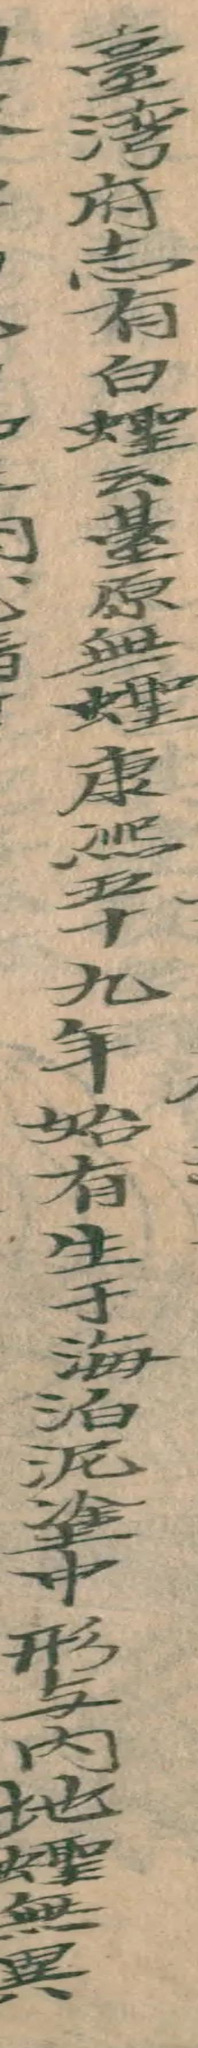臺湾府志有白蟶云臺原無蟶康熙五十九年始有生于海泊泥塗中形与内地蟶無異
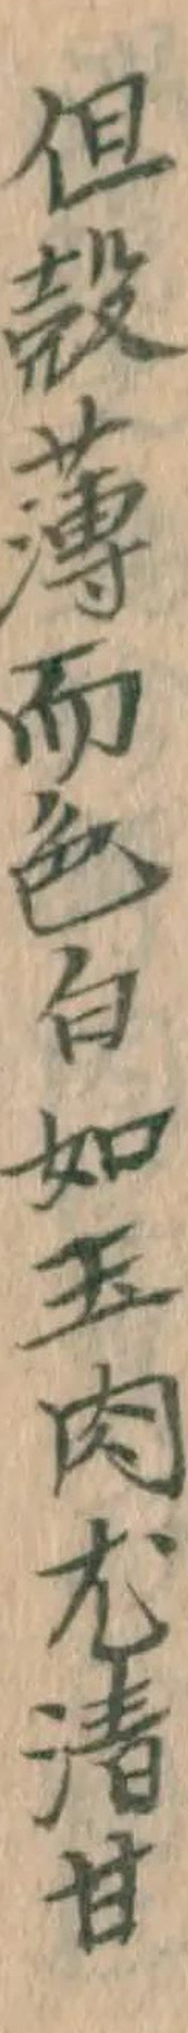但殻薄而色白如玉肉尤清甘
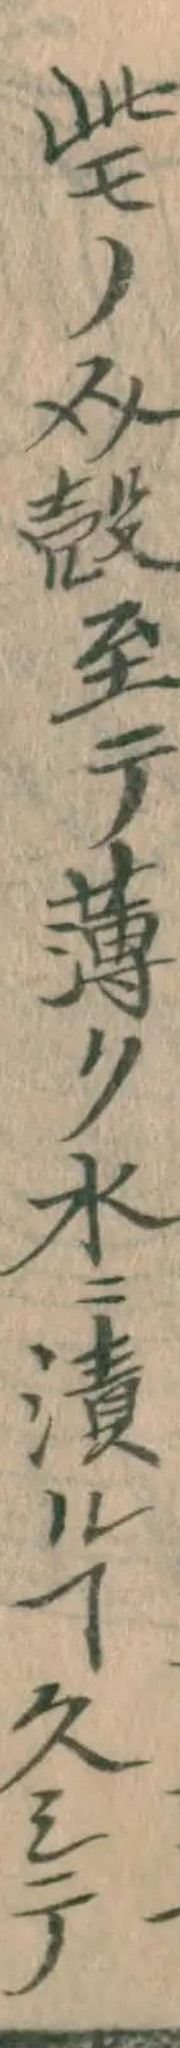此モノ介殻至テ薄ク水ニ漬ルコト久シテ
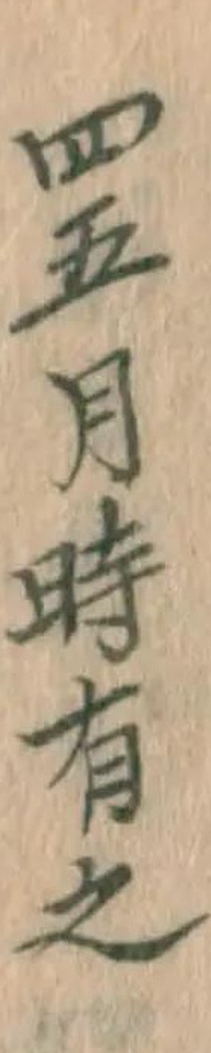四五月時有之
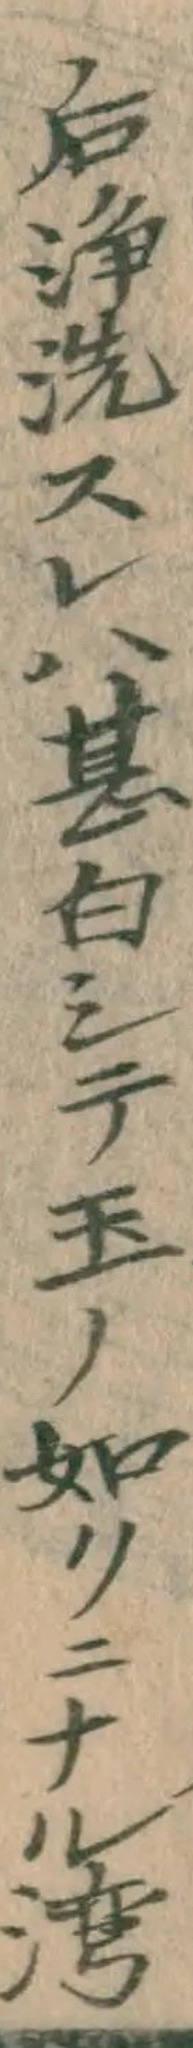后浄洗スレハ甚白シテ玉ノ如クニナル湾
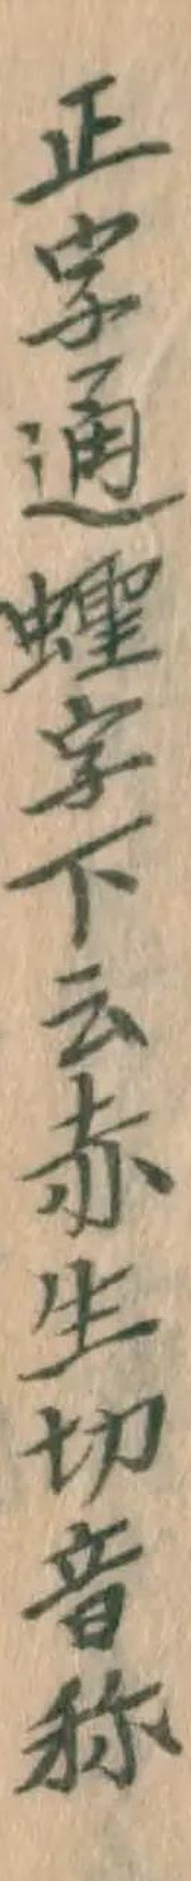正字通蟶字下云赤生切音称
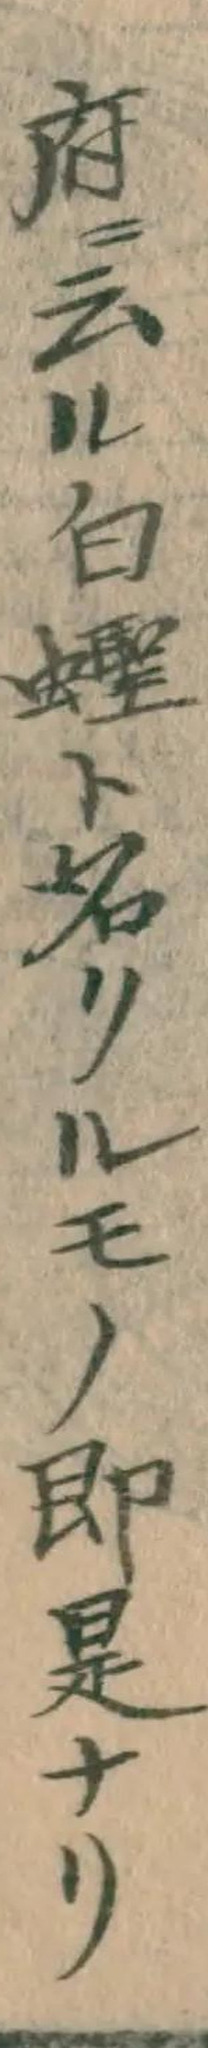府ニ云ル白蟶ト名クルモノ即是ナリ
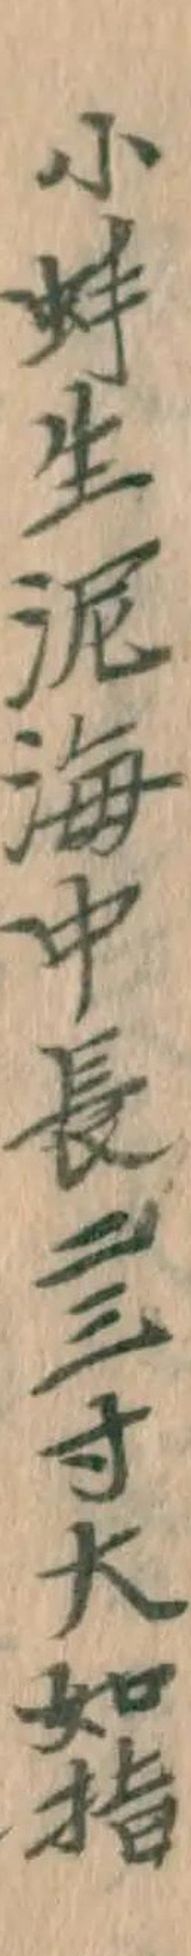小蚌生泥海中長二三寸大如指
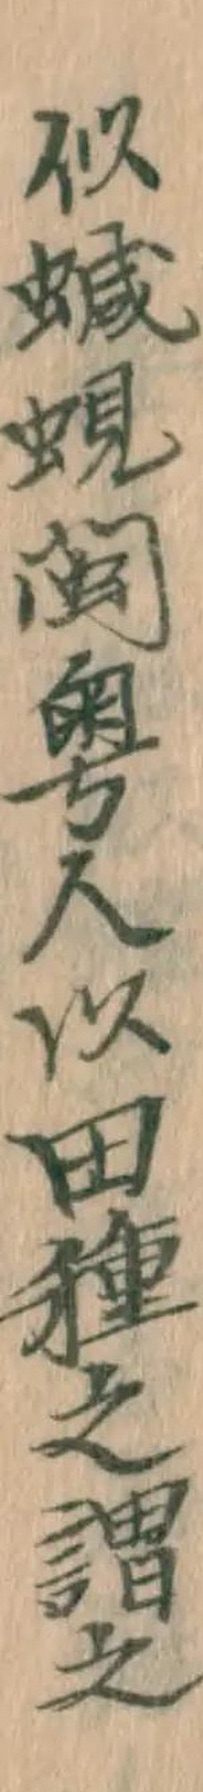似蜮蜆閩粤人以田種之謂之
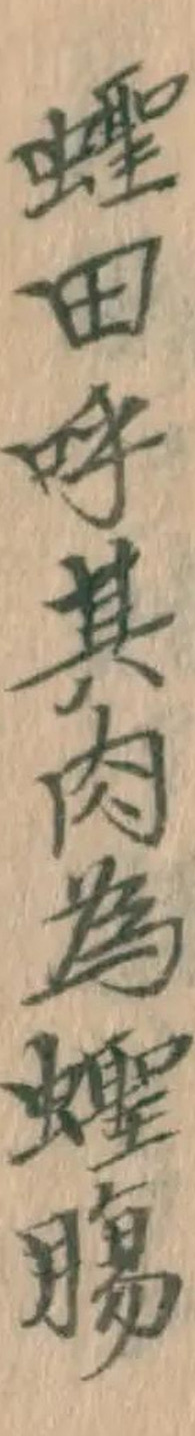蟶田呼其肉為蟶膓
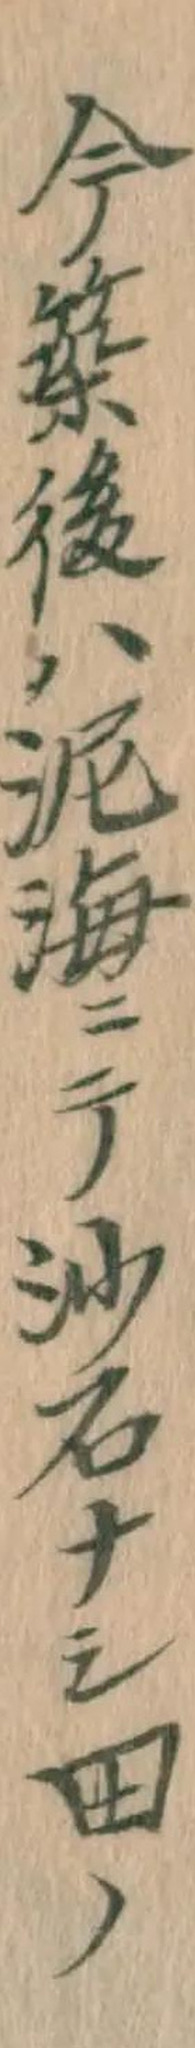今築後ハ泥海ニテ沙石ナシ田ノ
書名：千蟲譜 3巻. [1]
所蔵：国立国会図書館 National Diet Library, JAPAN
